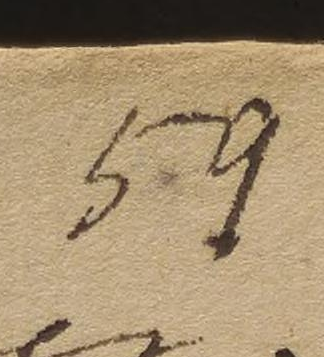59
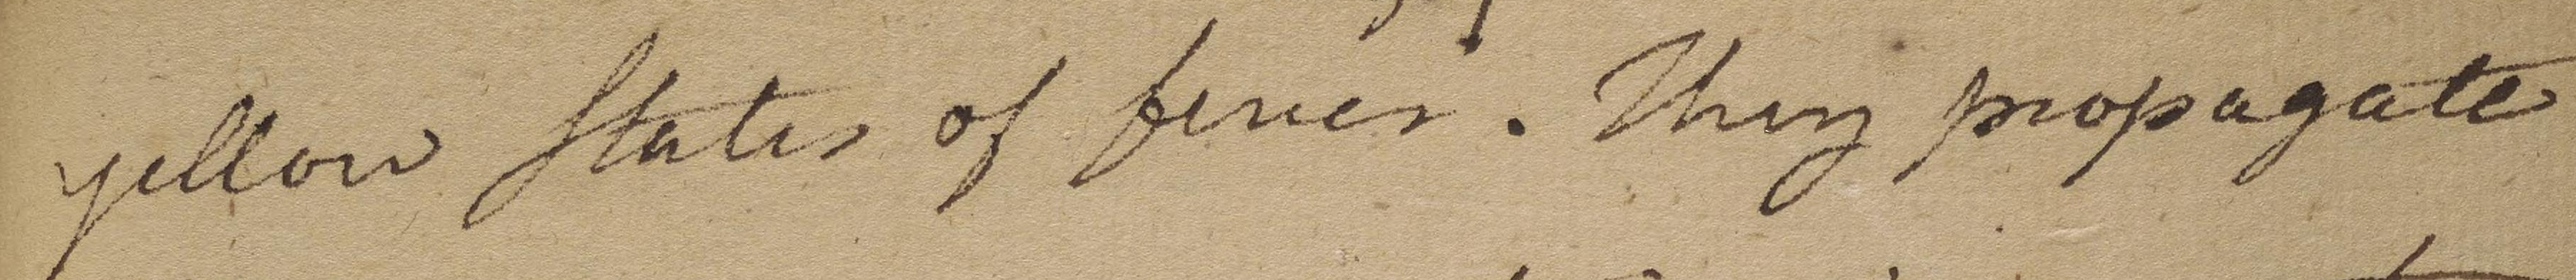yellow states of fever. They propagate
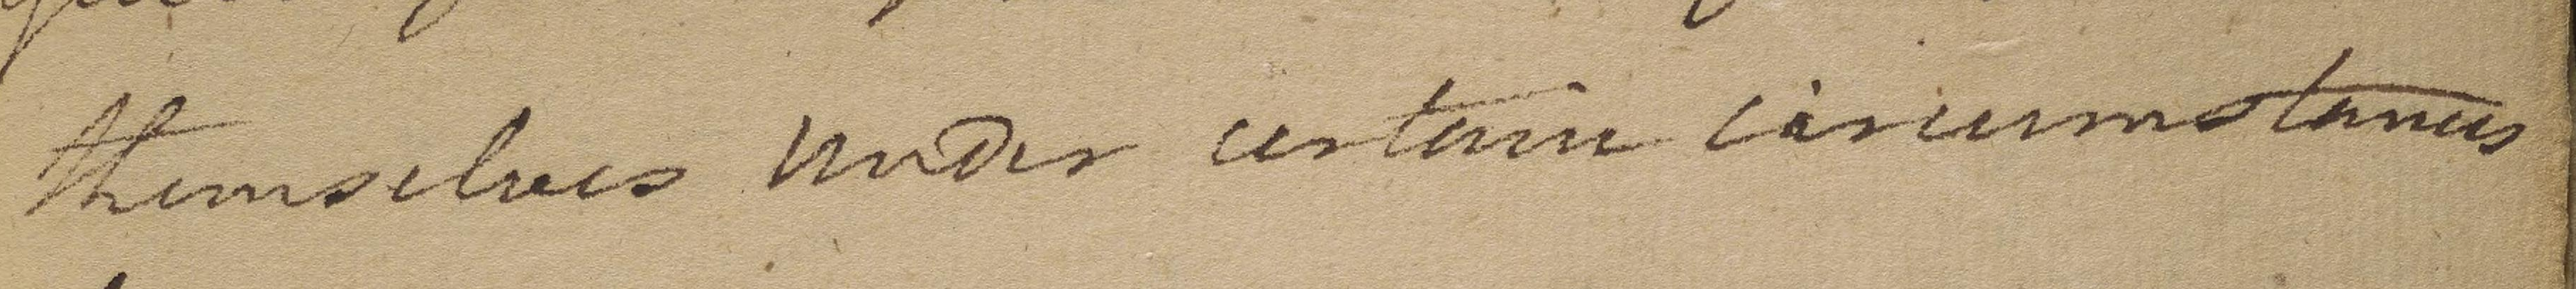themselves under certain circumstances
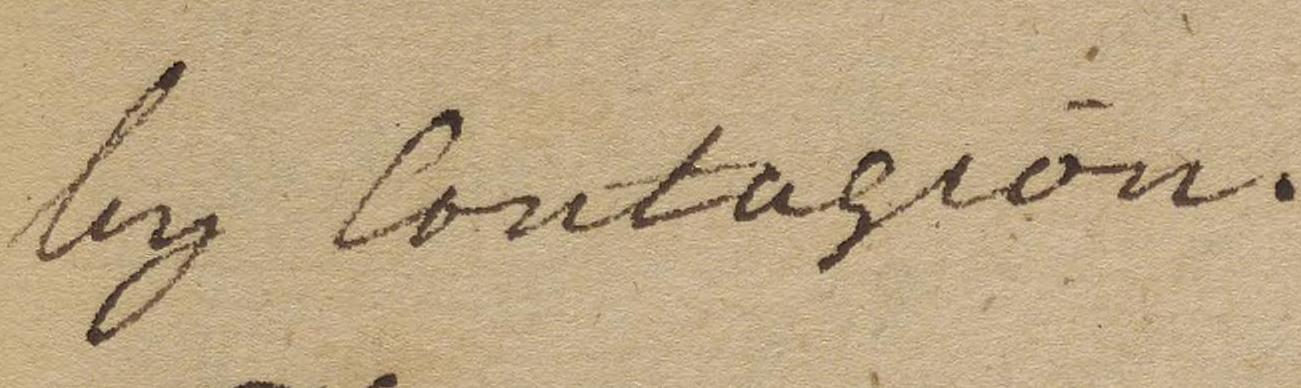by contagion.
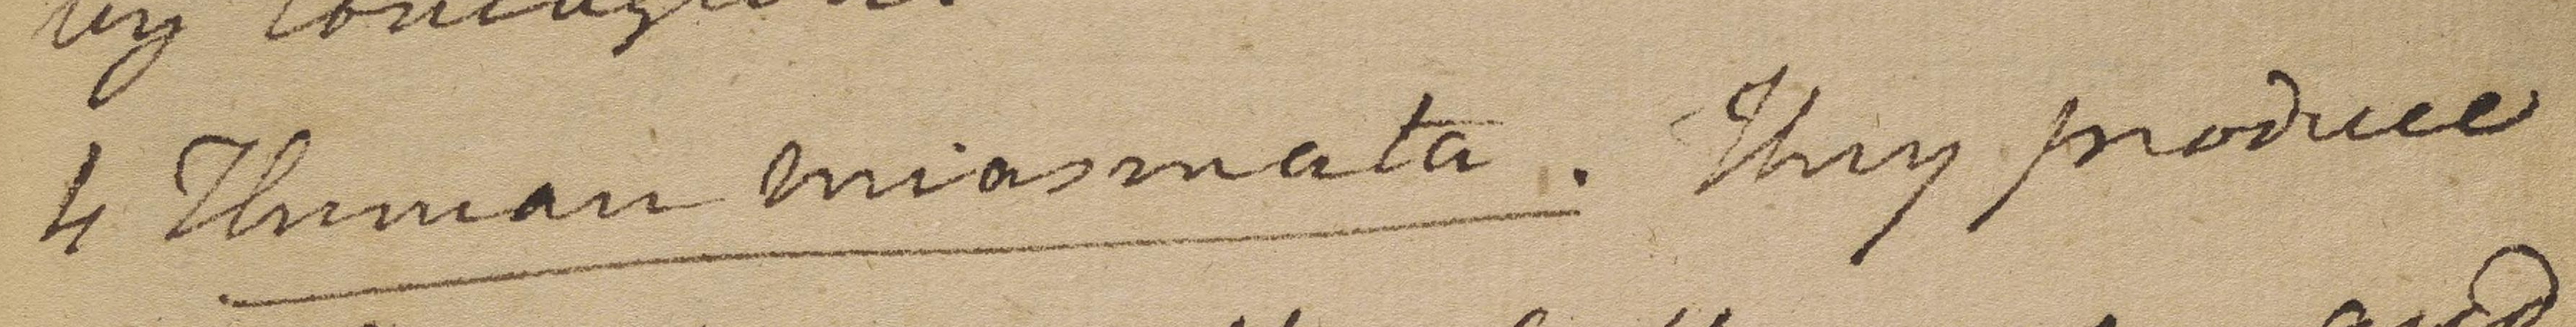4 Human miasmata. They produce
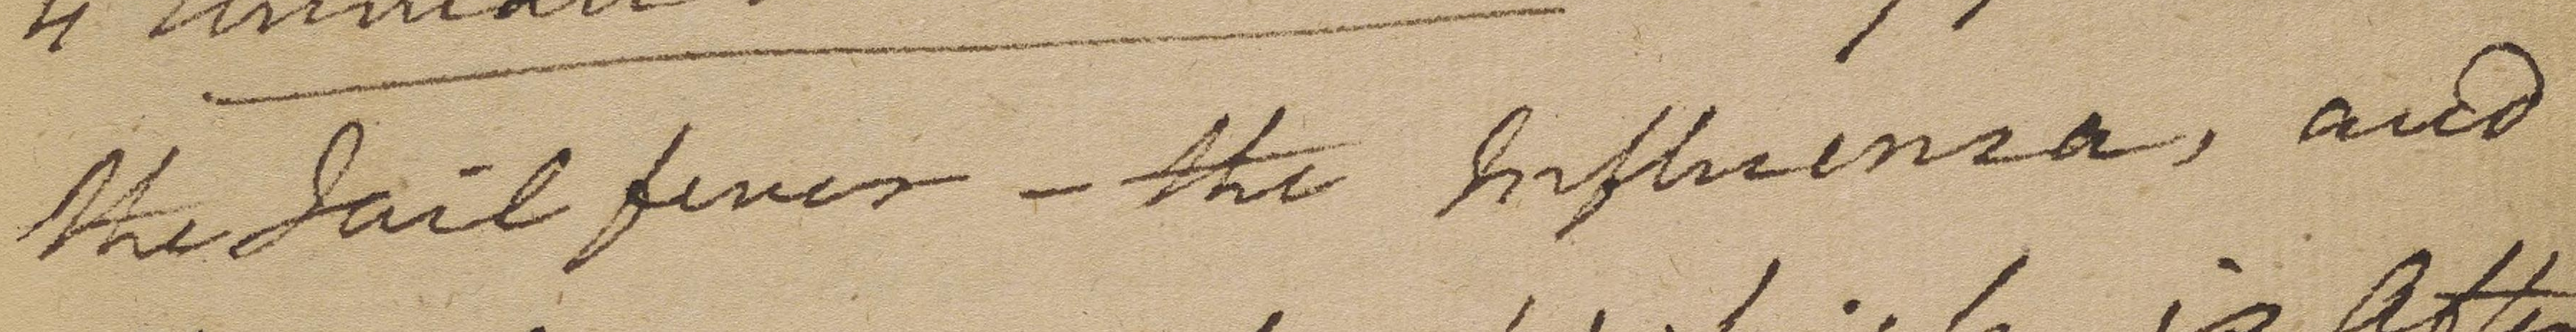the Jail fever- the Influenza, and
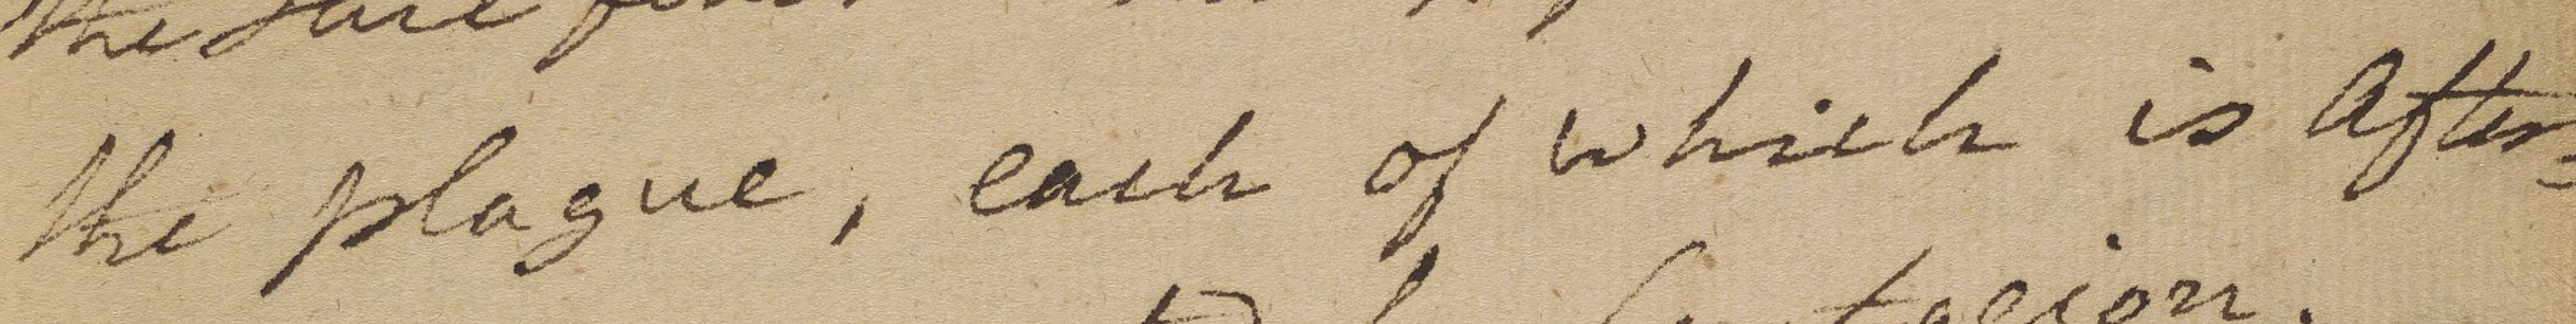the plague, each of which is after-
